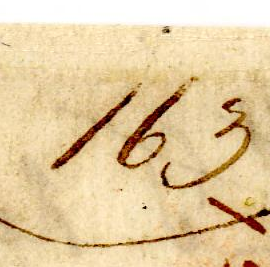163
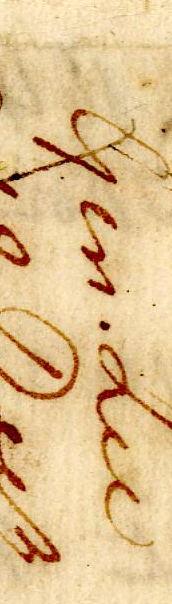Gen. Lee
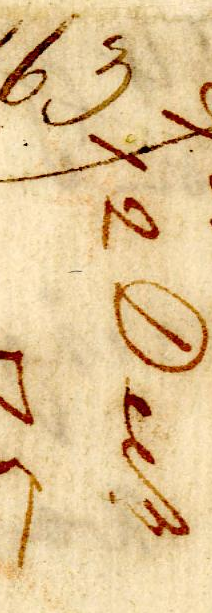12 Dec^r.
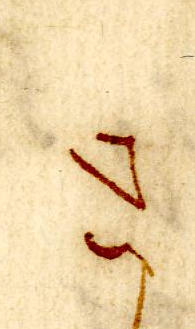75
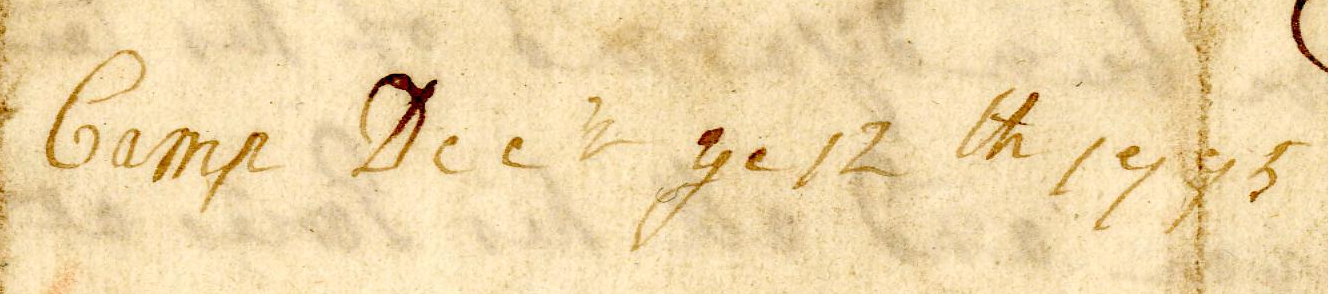Camp Dec^r ye 12^th 1775
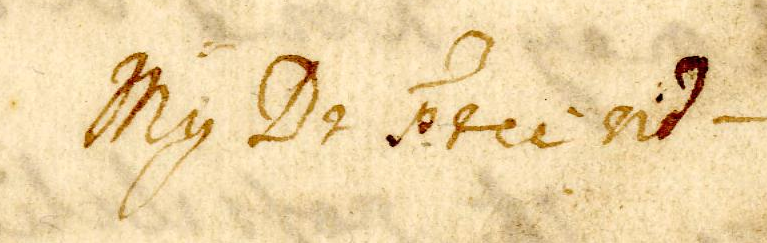My Dr Friend
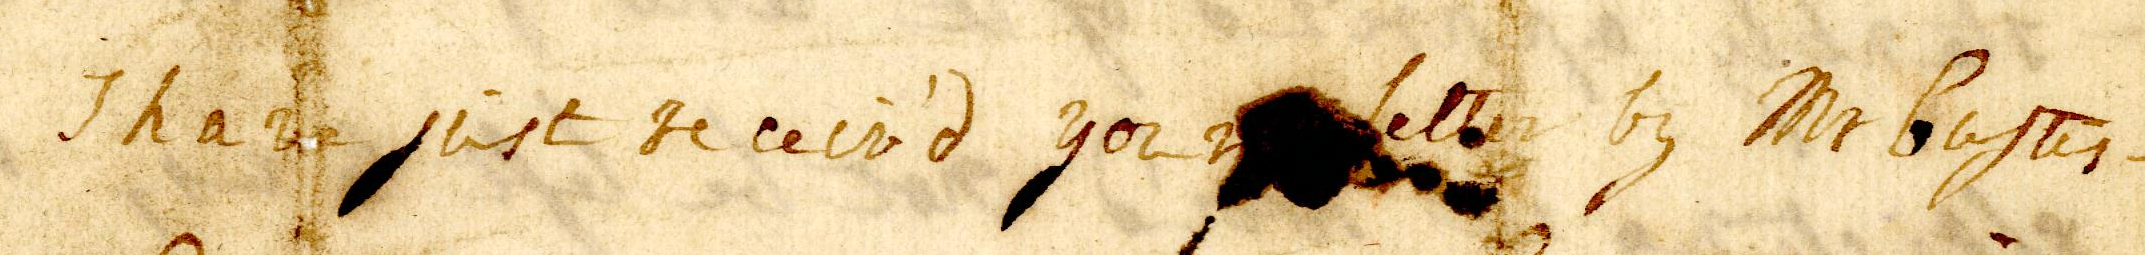I have just receiv'd your letter by Mr Caster
